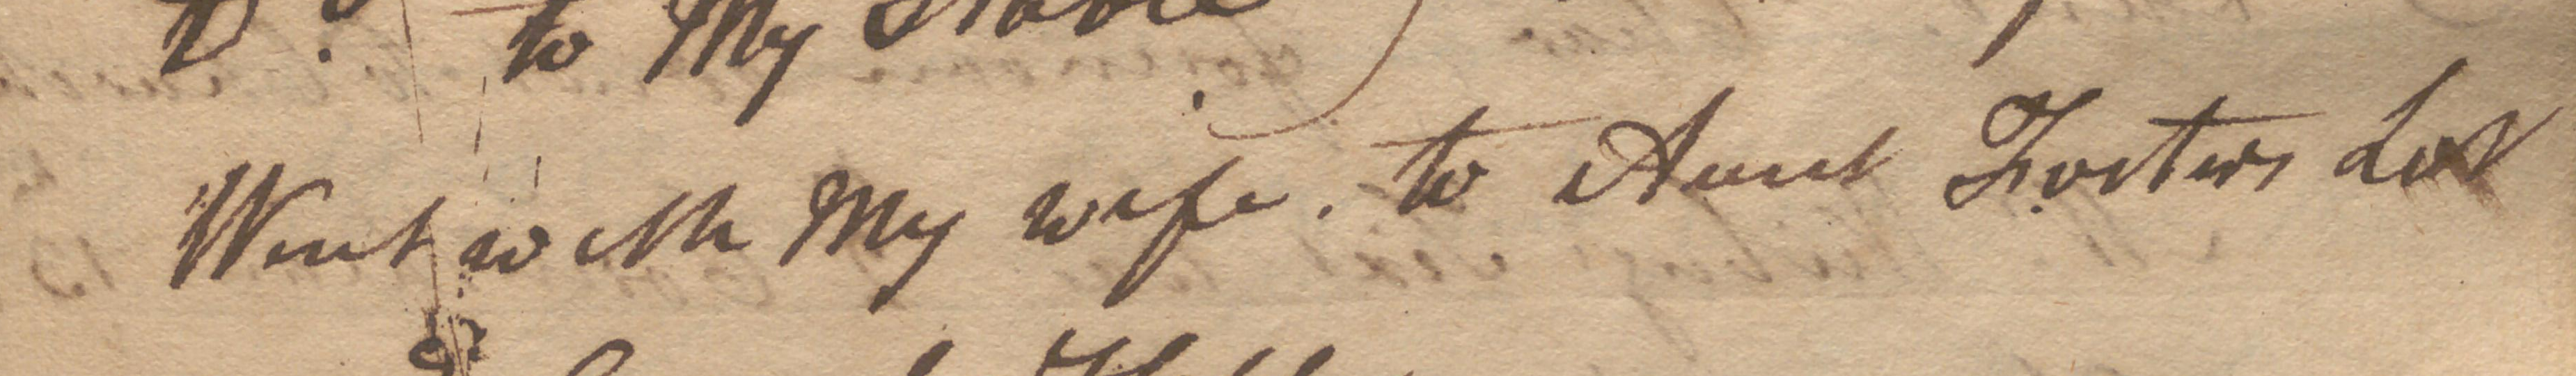Went with My wife. to Aunt Fosters Lot
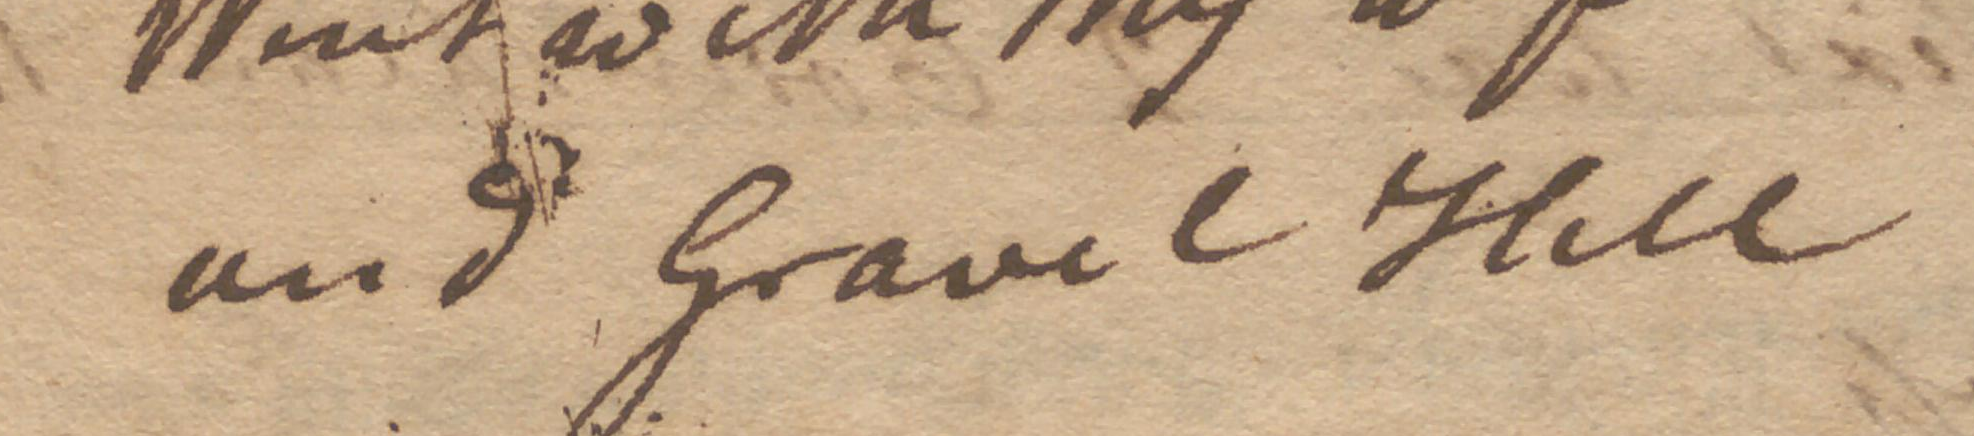and Gravel Hill
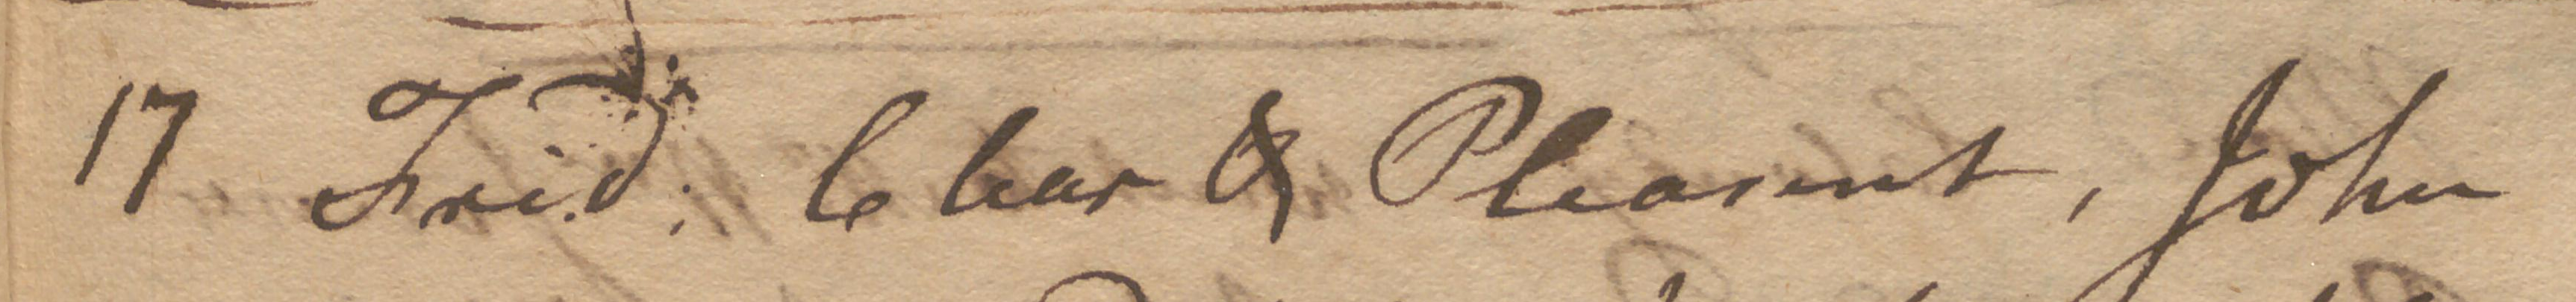17 Frid; Clear & Pleasent, John
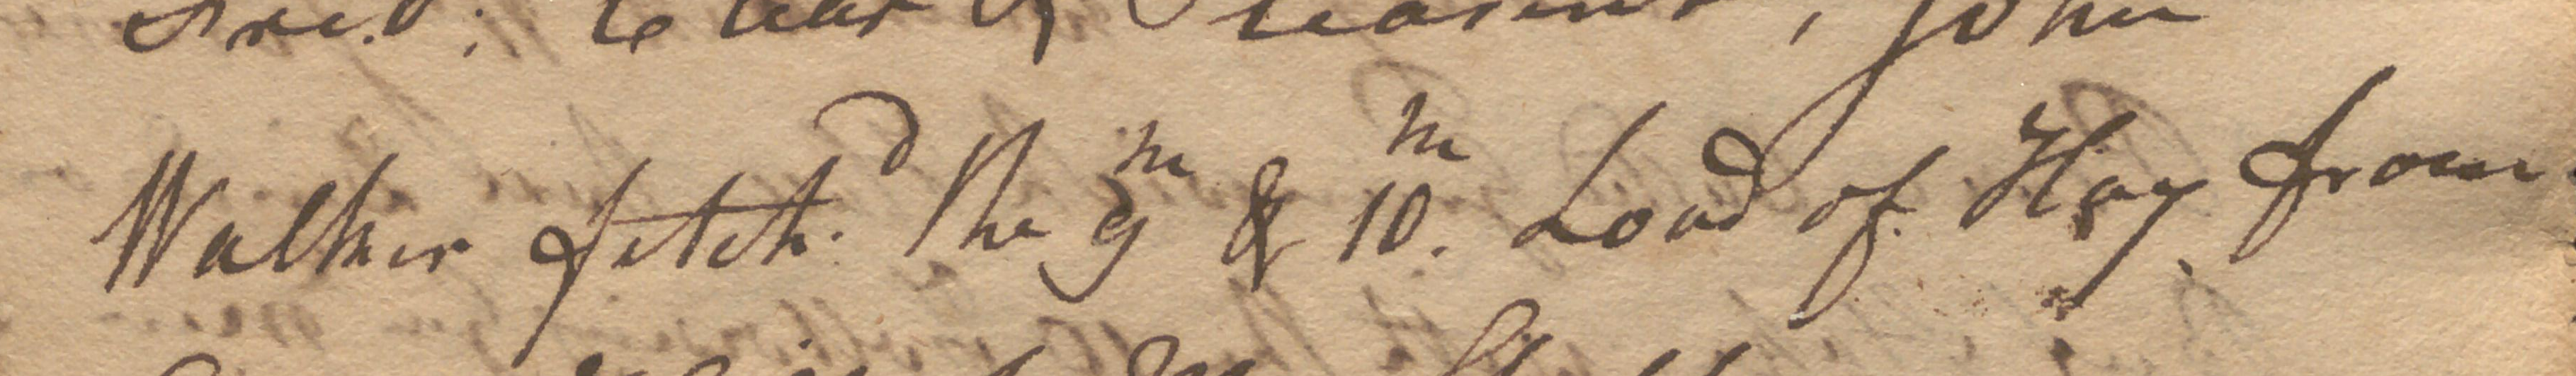Walker fetch^d the 9^th & 10^th. Load of Hay from
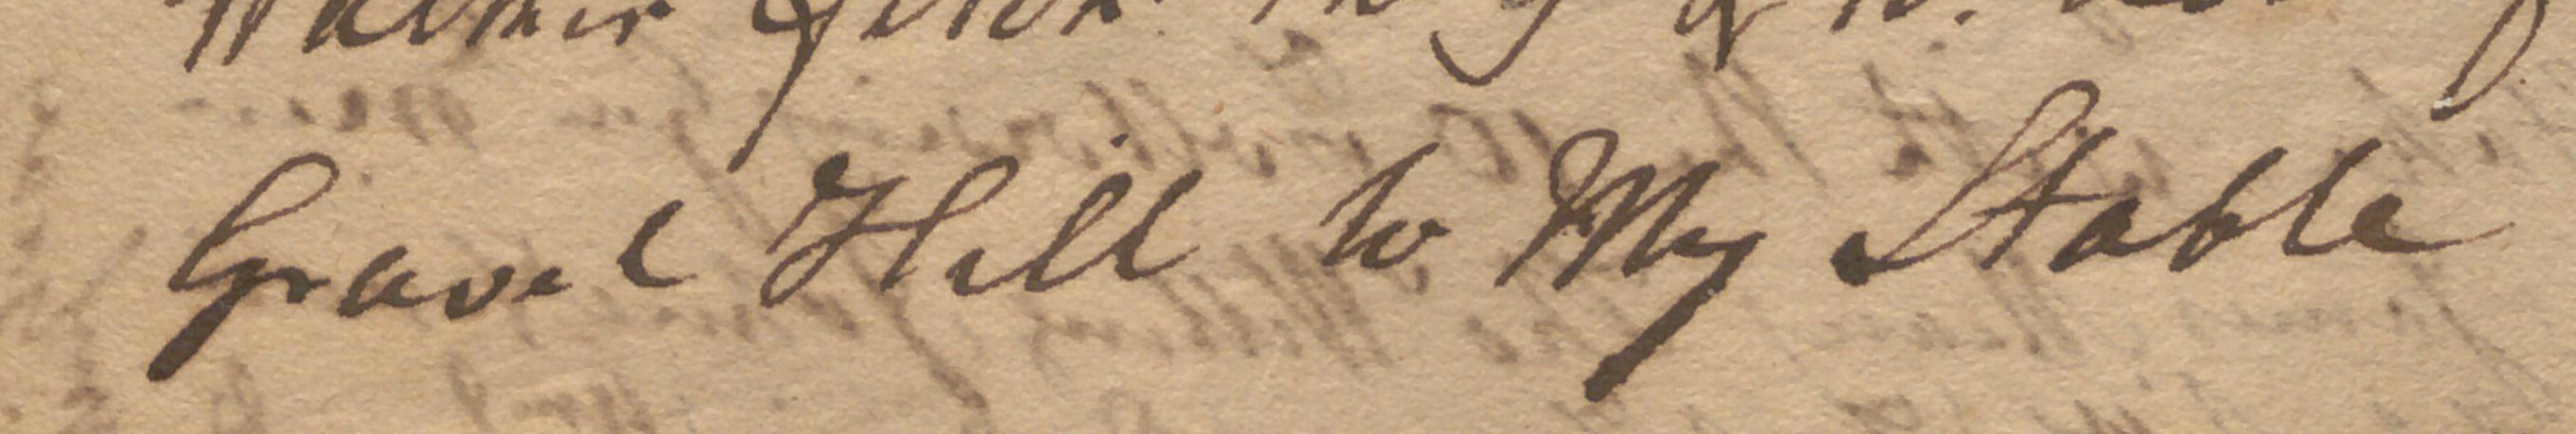Gravel Hill to My Stable
